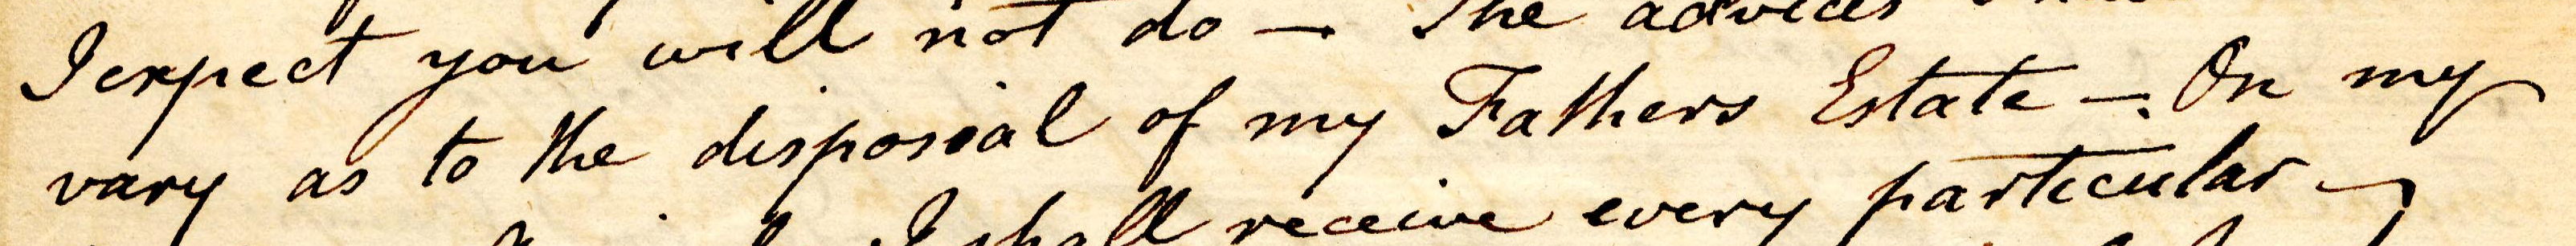vary as to the disposal of my Fathers Estate. On my
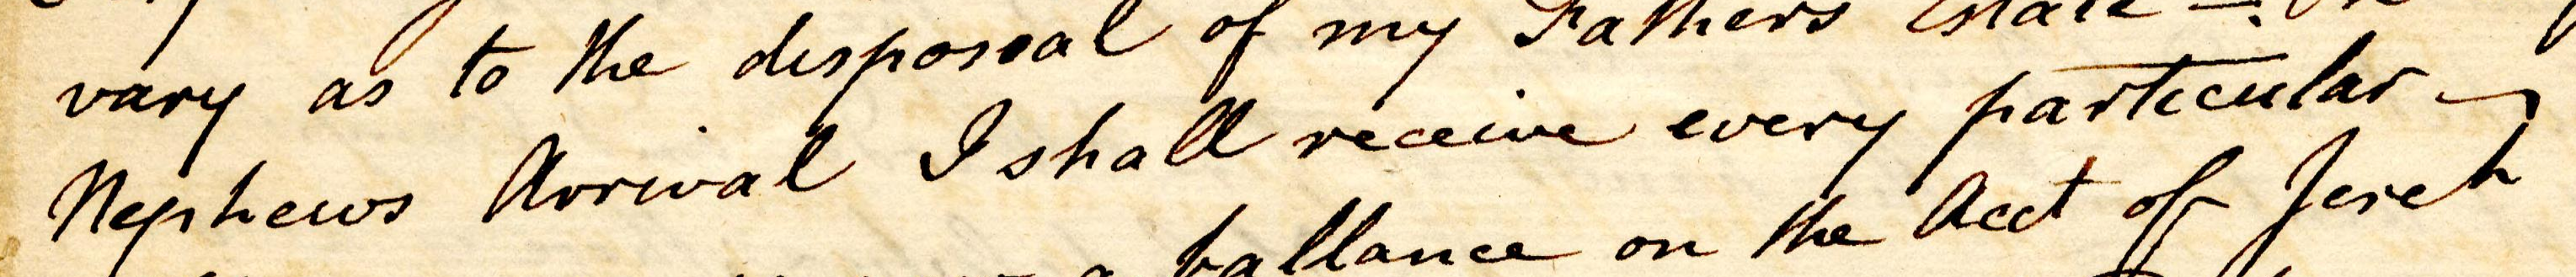Nephews Arrival I shall receive every particular
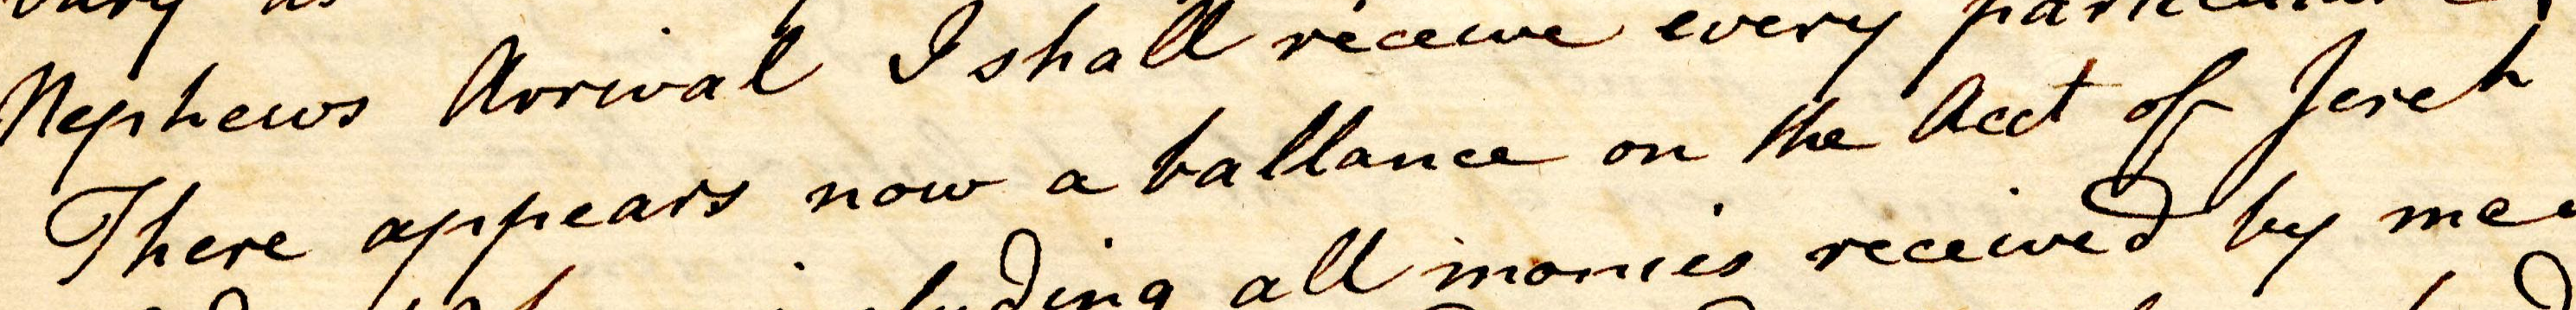There appears now a ballance on the Acct of Jere^h
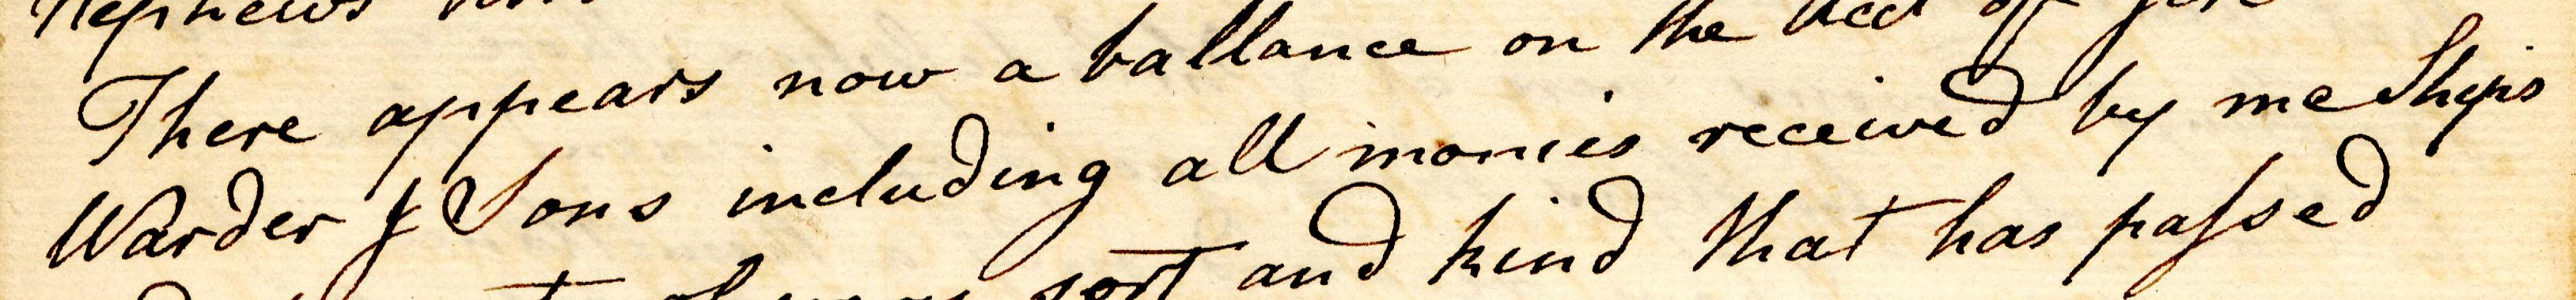Warder & Sons including all monies received by me Ships
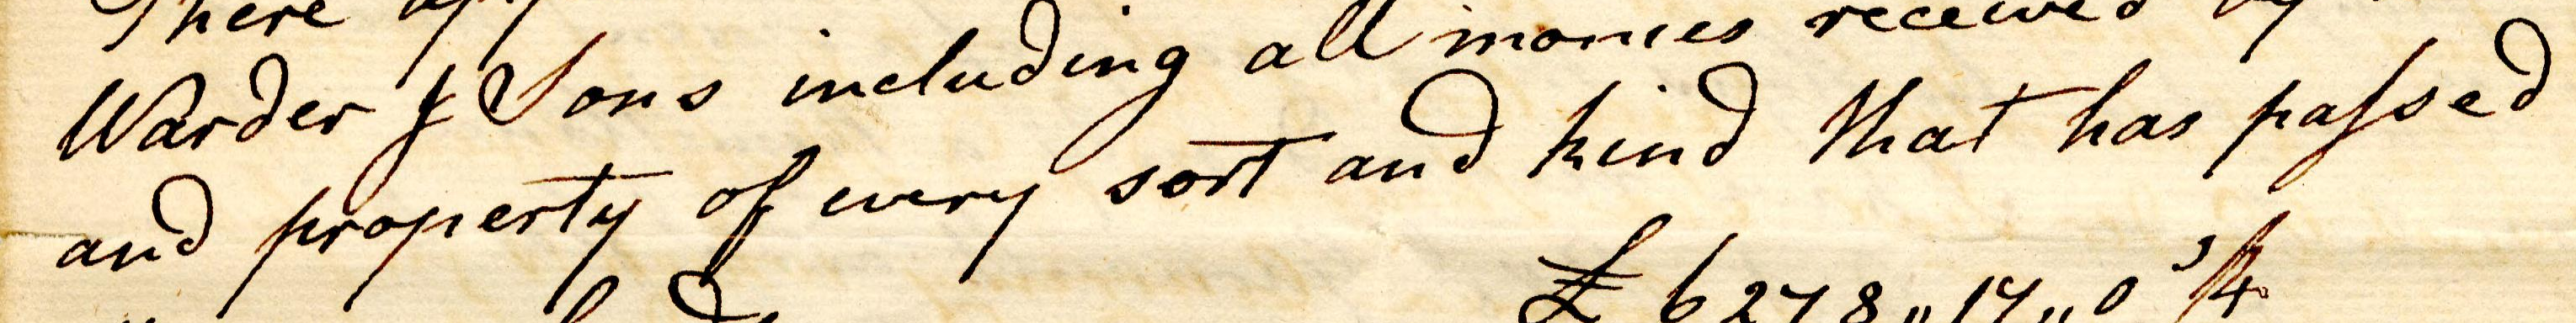and property of every sort and kind that has passed
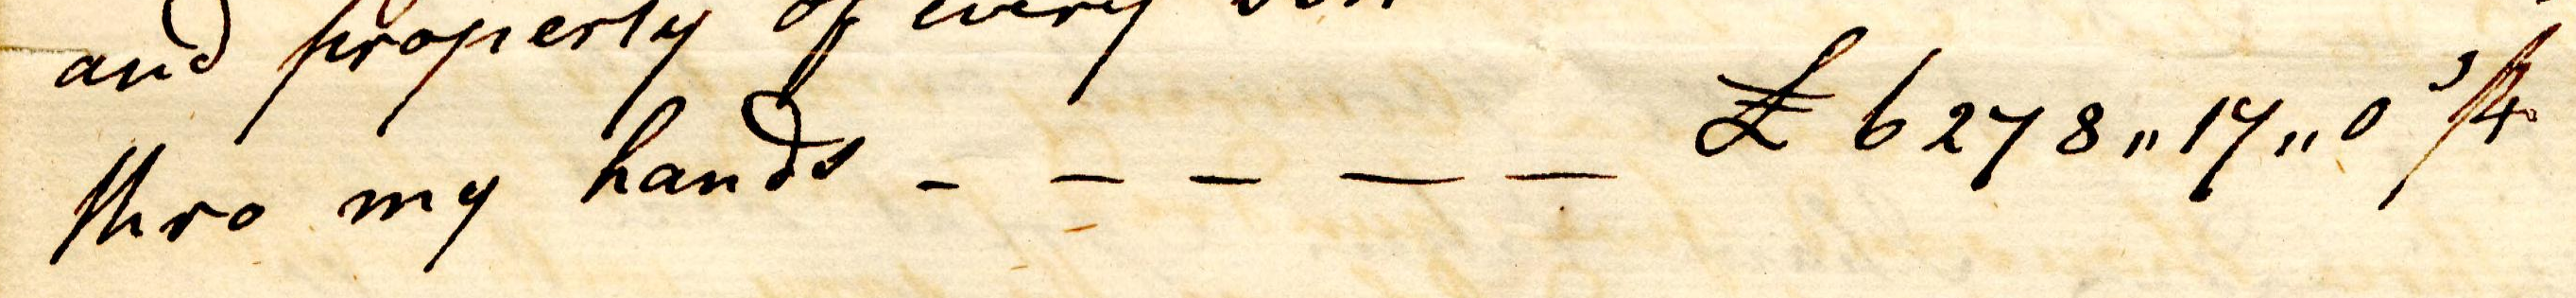thro my hands----- £6278. .17..0 3/4
